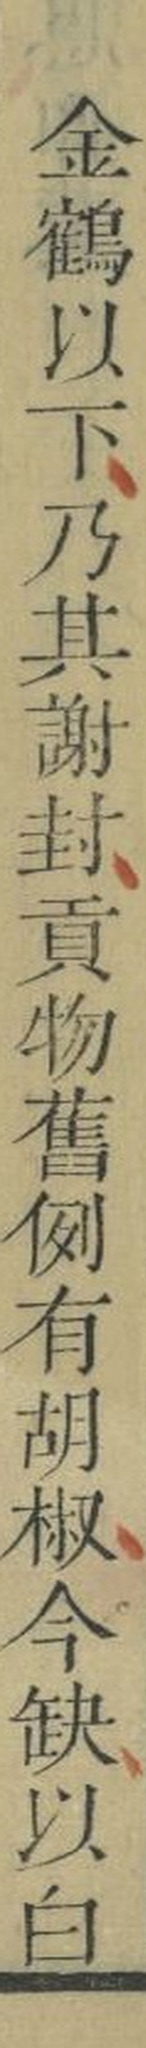金鶴以下乃其謝封貢物舊例有胡椒今缺以
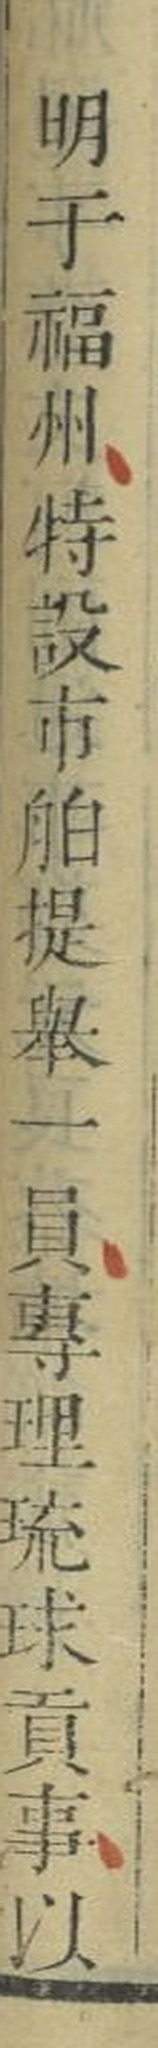明于福州特設市舶提舉一員專理琉球貢事以
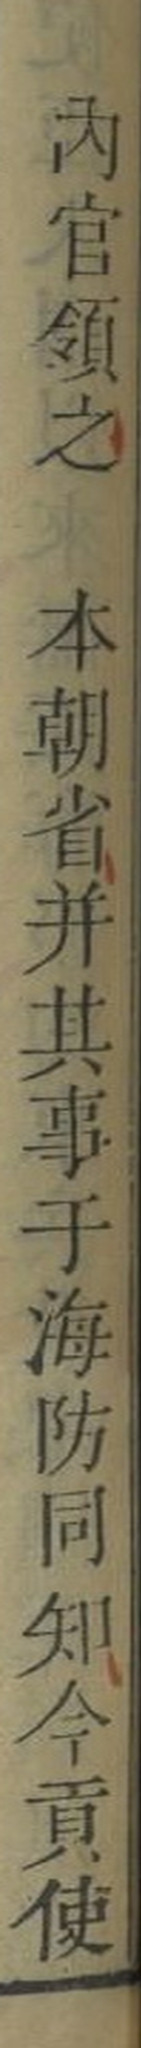内官領之本朝省并其事于海防同知令貢使
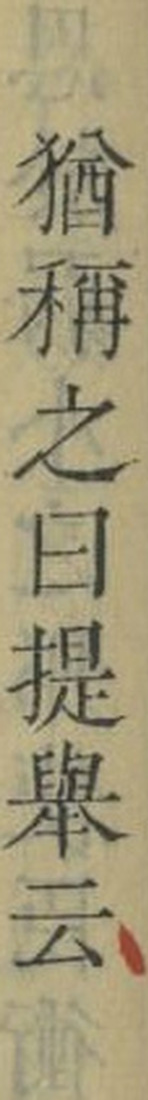猶稱之曰提舉云
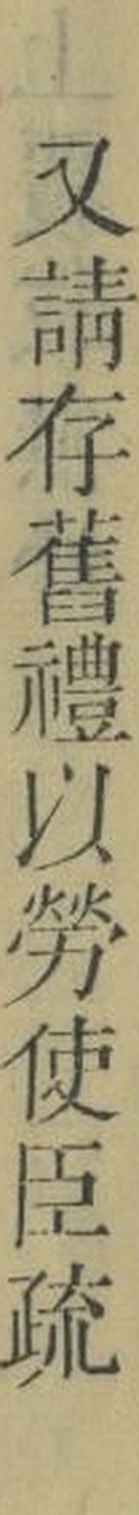又請存舊禮以勞使臣疏
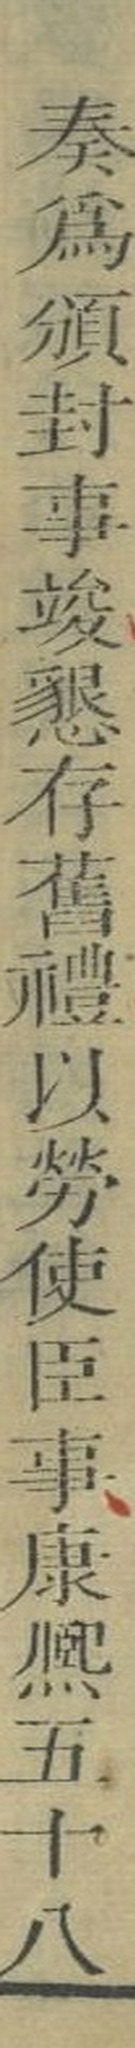奏爲領封事竣懇存舊禮以勞使臣事康熈五十八
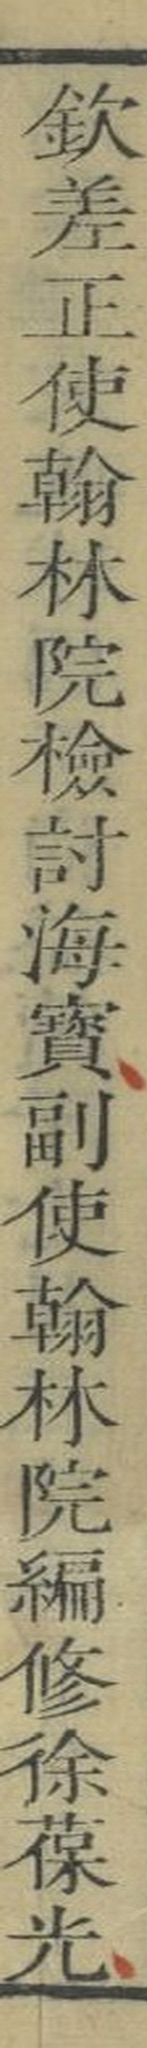欽差正使翰林院檢討海寶副使翰林院編修徐葆光
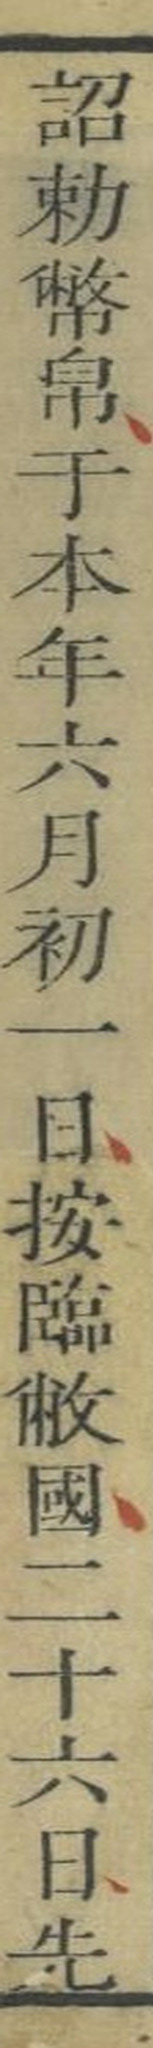詔勅幣帛于本年六月初一日按臨敝國二十六日先

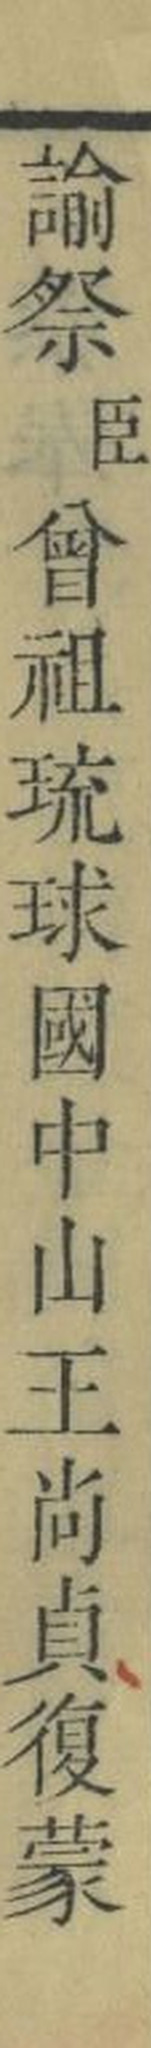諭祭臣曾祖琉球國中山王尚貞復蒙
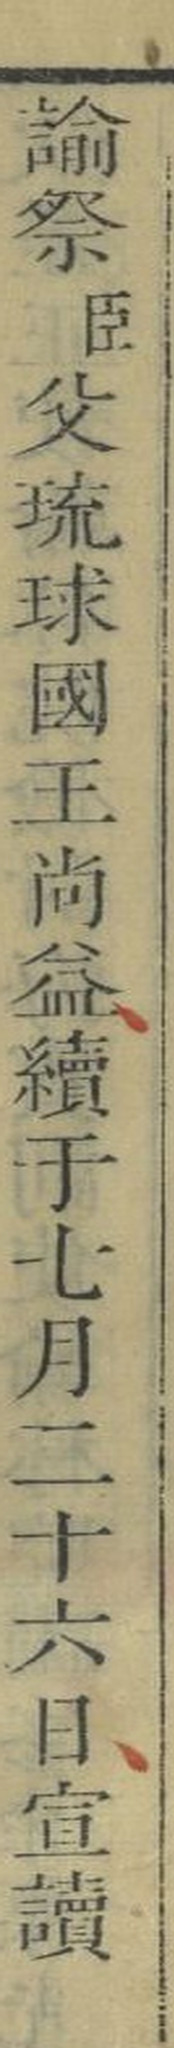諭祭臣父琉球國王尚益續于七月二十六日宣讀
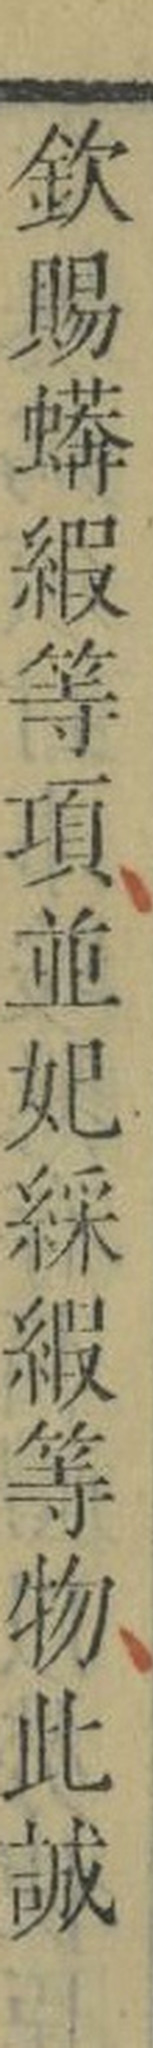欽賜蠎縀等項並妃綵縀等物此誠
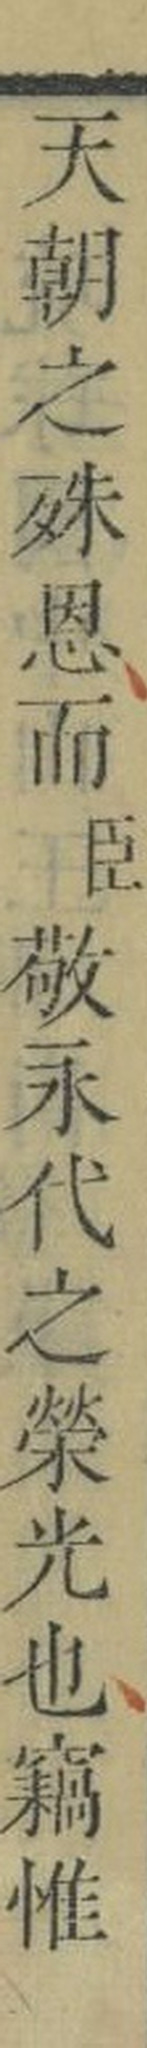天朝之殊恩而臣敬永代之榮光也竊惟
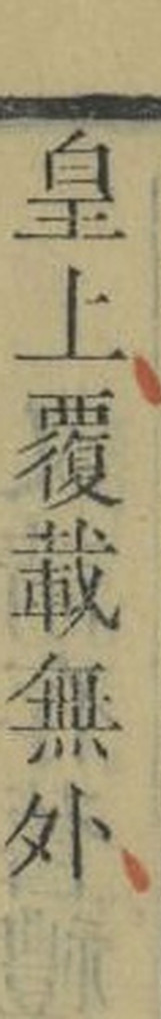皇上覆載無外
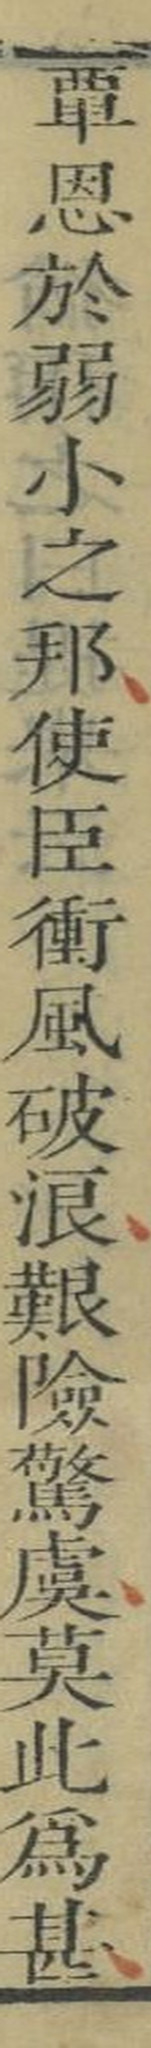覃恩於弱小之邦使臣衝風破浪艱險驚虞莫此爲甚
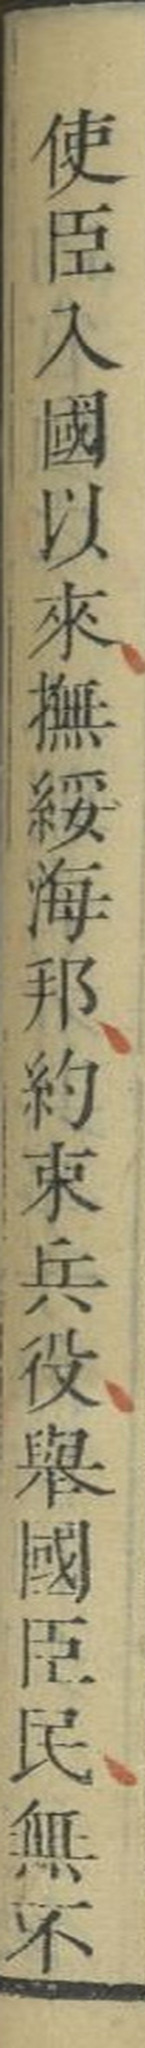使臣入國以來撫綏海邦約束兵役舉國臣民無不
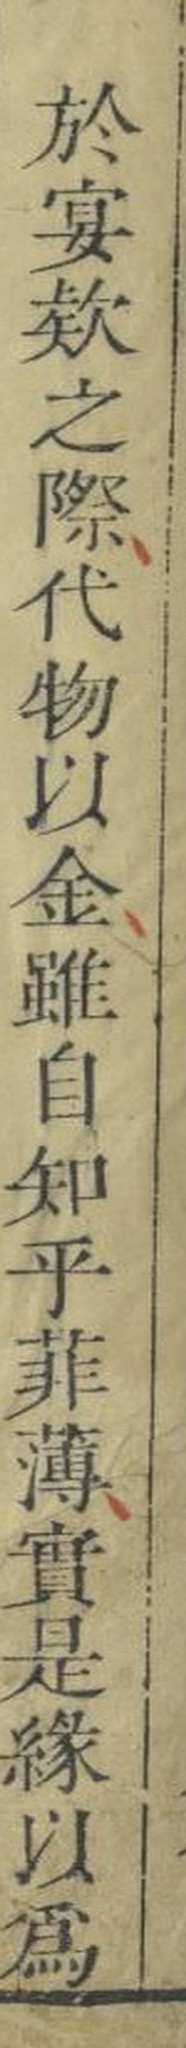於宴欵之際代物以金雖自知乎菲薄實是緣以爲
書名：中山伝信録 巻一、巻二
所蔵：University of the Ryukyus Library
